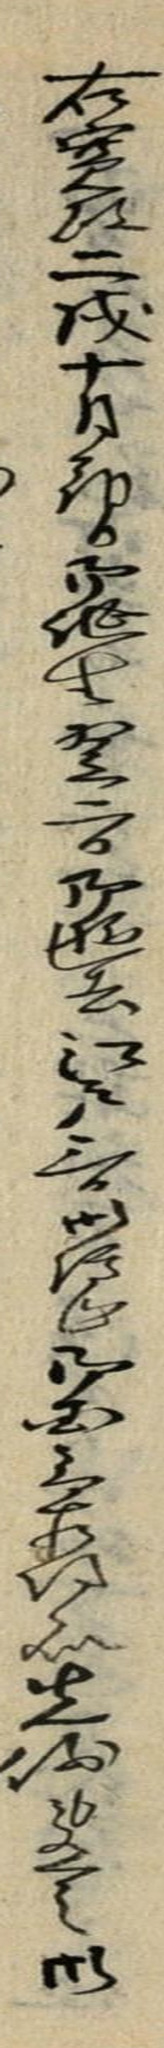右寛政二戌十月朔日御誕生翌二日御逝去江戸三日御停止御国にて相伺候処先例も有之御
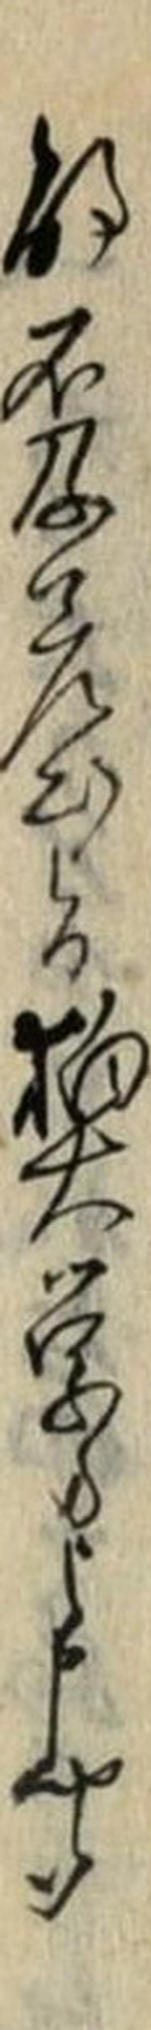触不及差出旨狛大学方被申聞
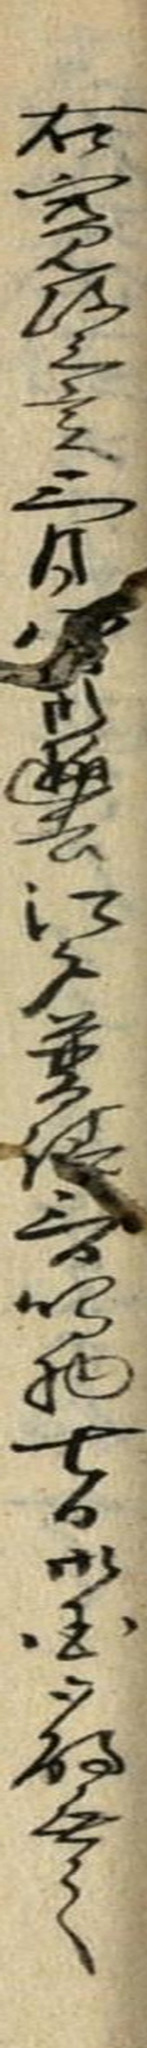右寛政三亥三月八日御逝去江戸普請三日鳴物七日御国御触無之
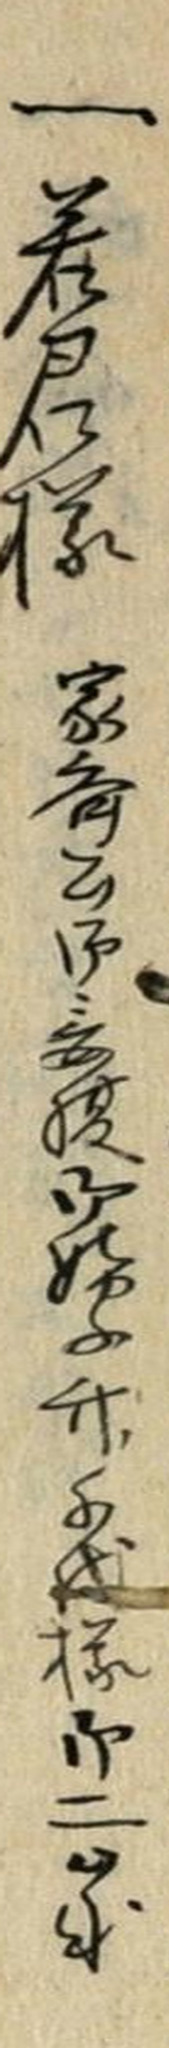一若君様家斉公御妾腹御嫡子竹千代様御二歳
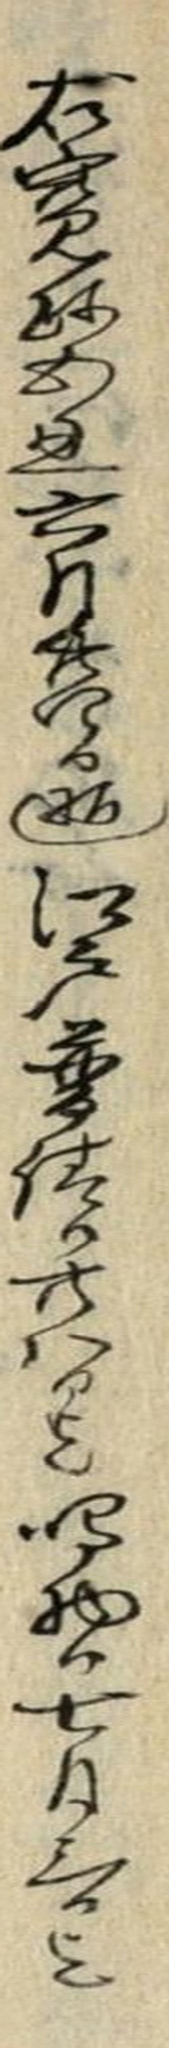右寛政五丑六月廿四日逝江戸普請は廿八日迄鳴物は七月三日迄
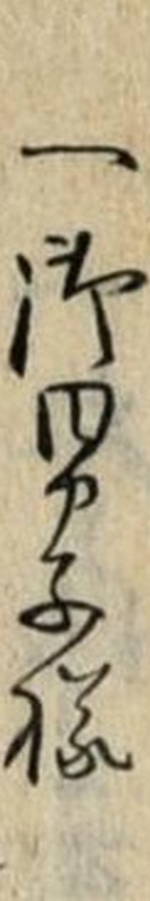一御男子様
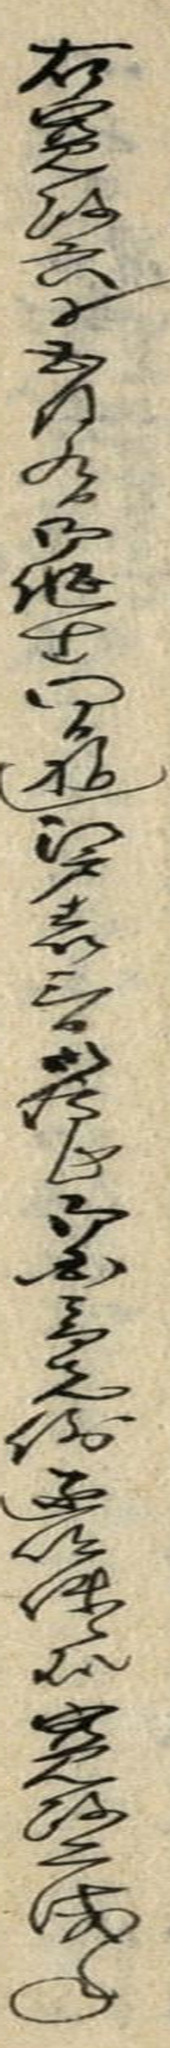右寛政六刁五月九日御誕生同日逝江戸表三日御停止御国にて先例遂吟味候処寛政二戌年
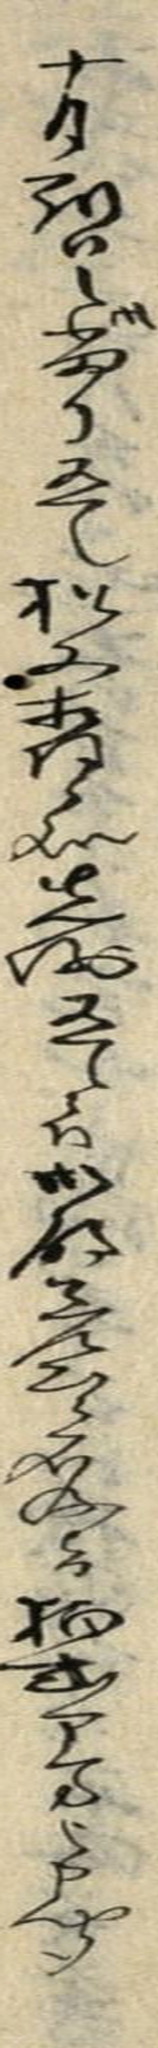十月朔日之御当り有之猶又相伺候処先例有之に付御触差出に不及旨狛式部方被申聞
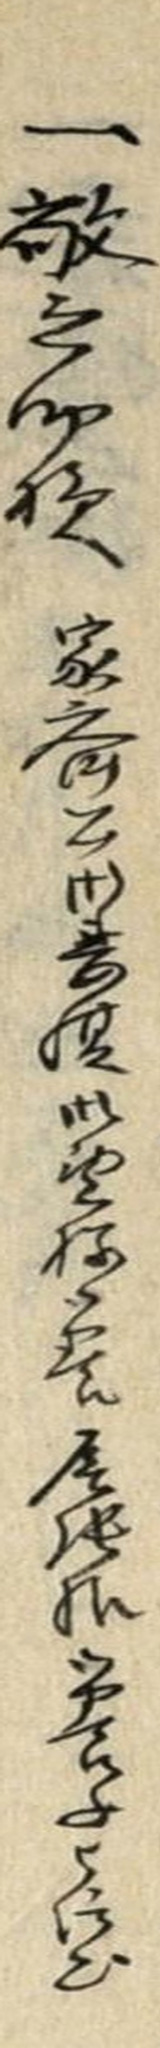一敬之助様家斉公御妾腹御台様御養尾張様御養子被仰出
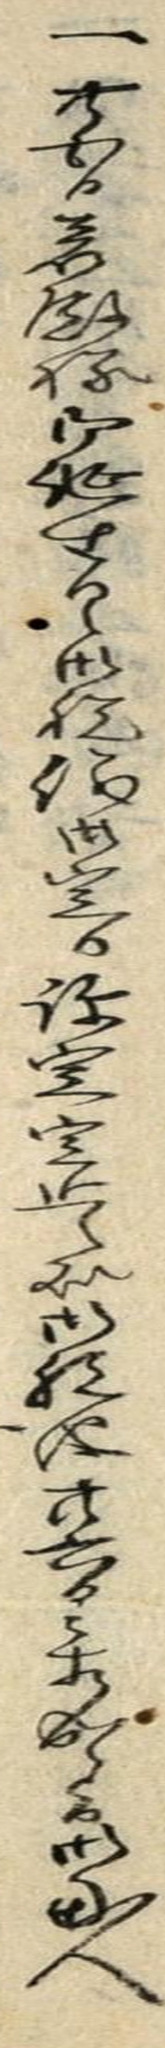一廿五日若殿様御誕生日之御祝儀御定日評定定止之処御祝儀廿六日に相成候旨御用人
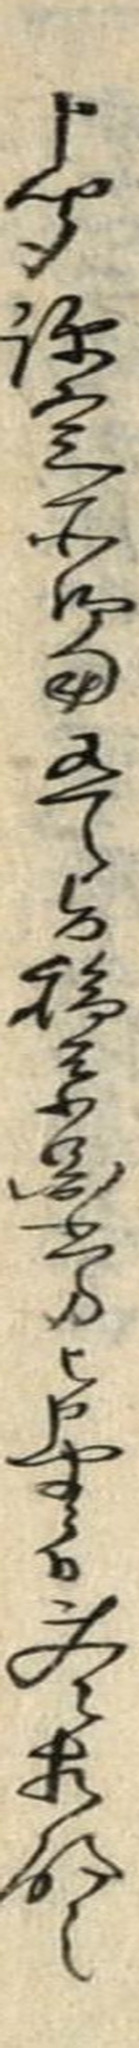申聞評定所御用有之旨稲葉図書方被申聞に付夫々相触之
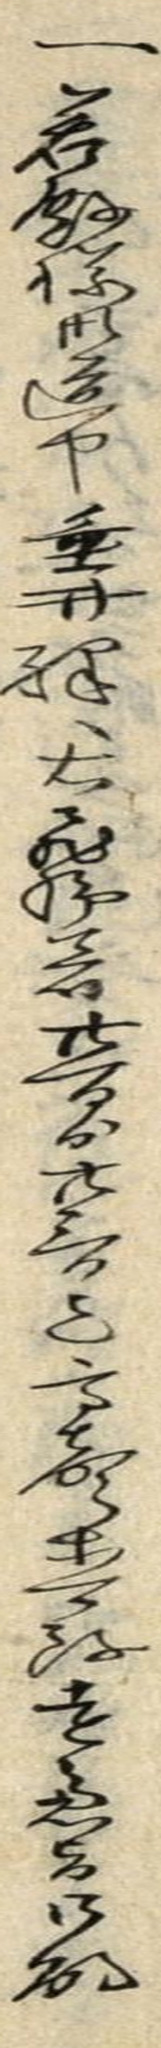一若殿様御道中垂井駅へ右飛脚着廿一日ゟ廿三日迄高声等可致遠慮旨御触
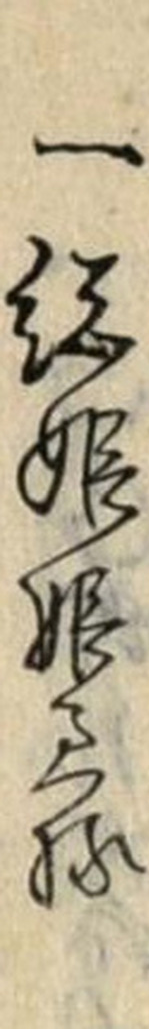一総姫姫君様
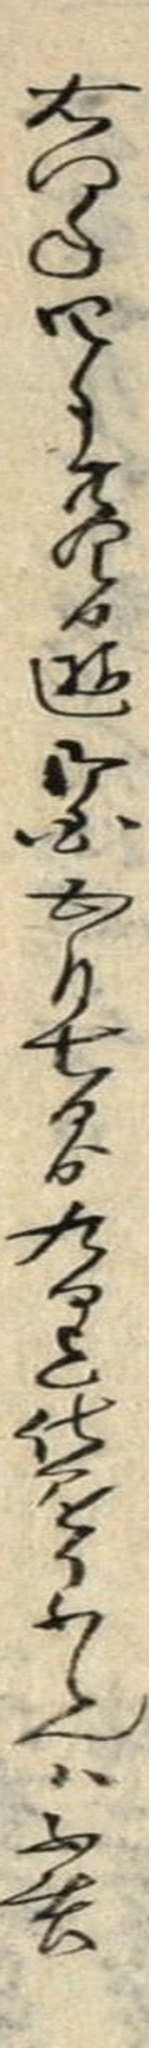右同年四月廿四日逝御国五月七日ゟ九日迄仕懸りふしんは不苦
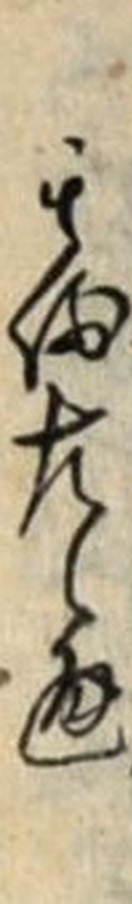其例左之通

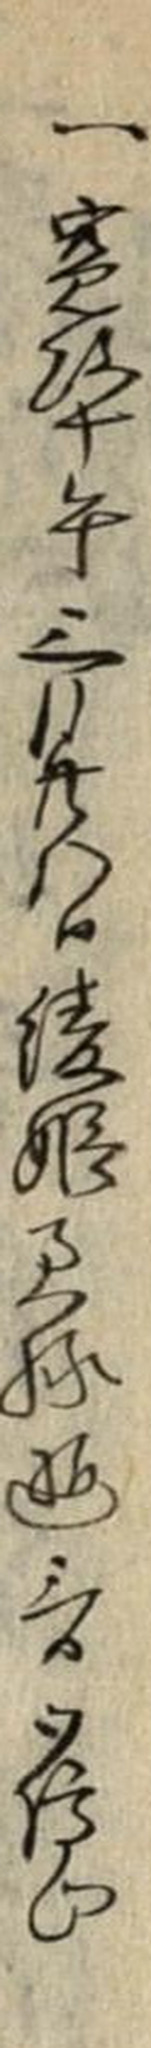一寛政十午三月廿八日綾姫君様逝三日御停止
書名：御停止異変死失
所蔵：福井県文書館 Fukui Prefectural Archives
